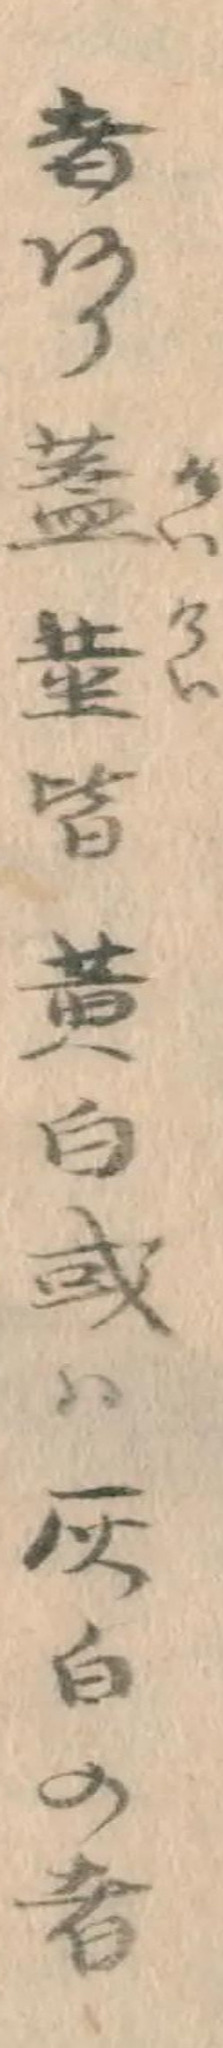者あり蓋茎皆黄白或は灰白の者
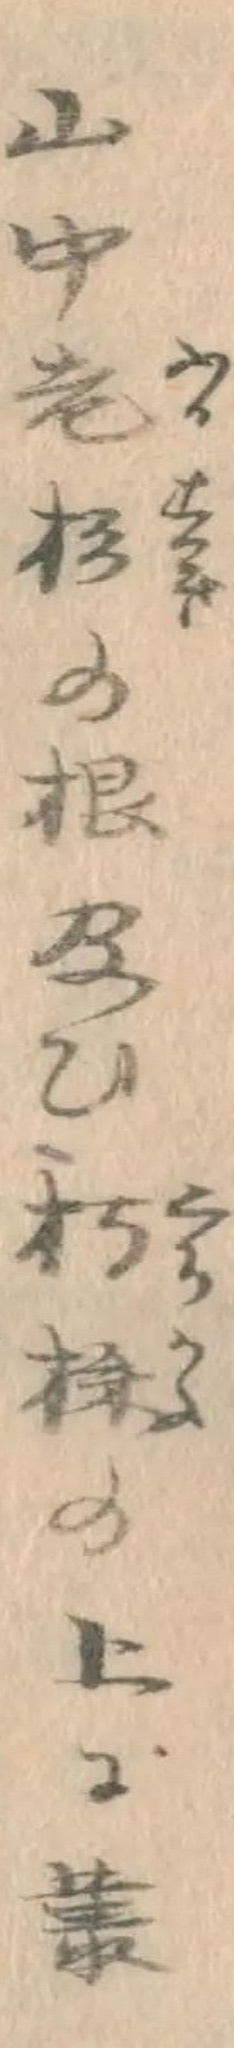山中老杉の根及ひ朽株の上に叢
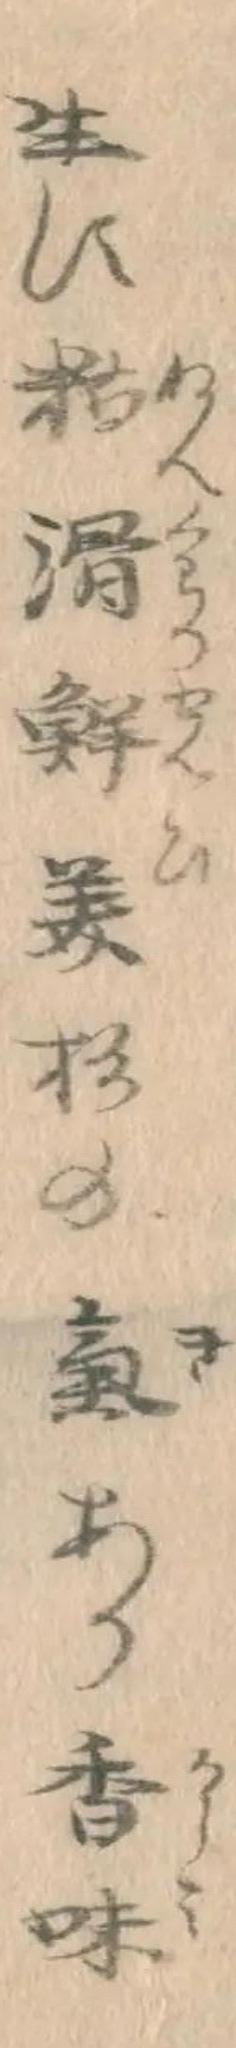生す粘滑鮮美杉の気あり香味
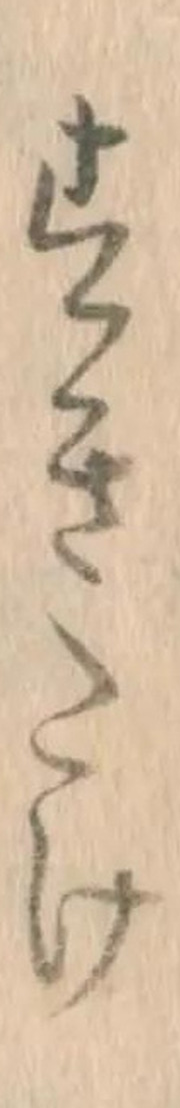すきたけ
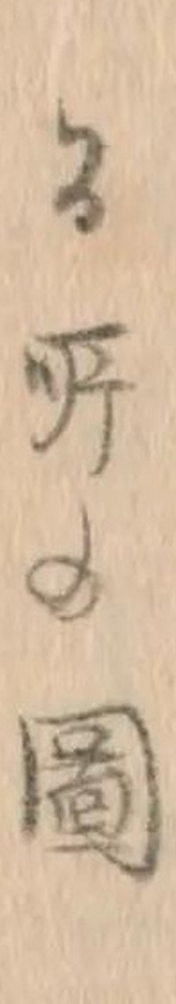る所の図
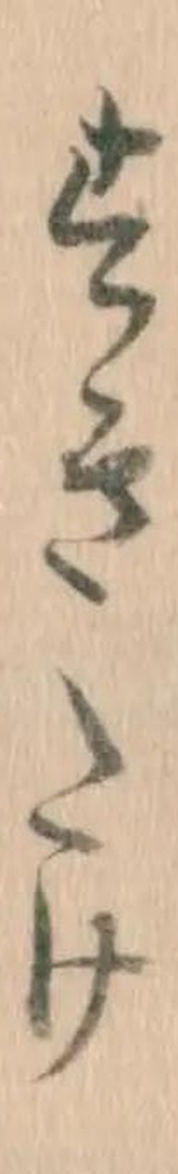すきたけ
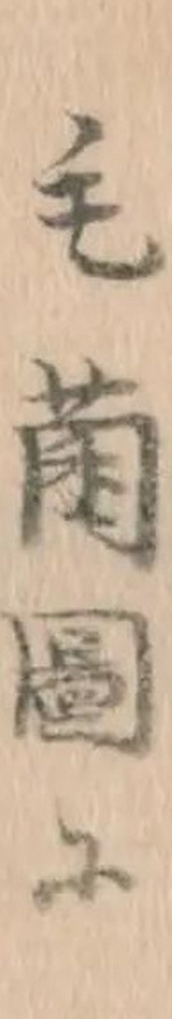毛菌図に
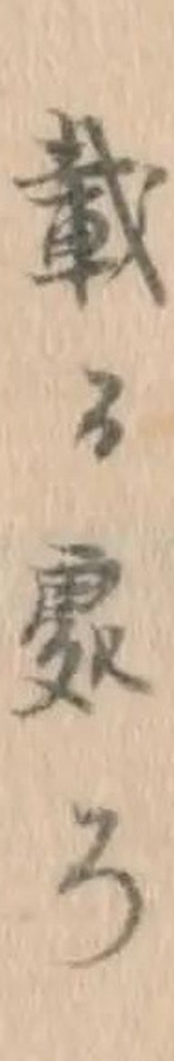載る処ろ

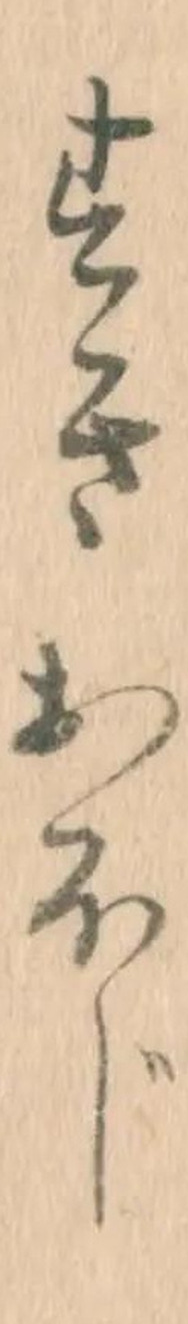すきおほじ
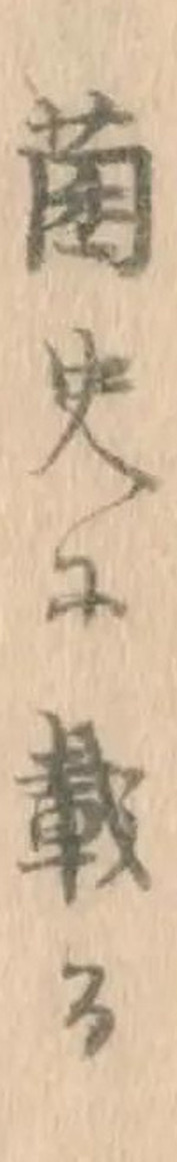菌史に載る
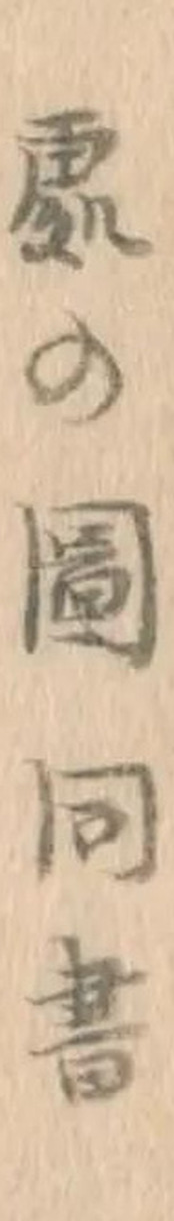処の図同書
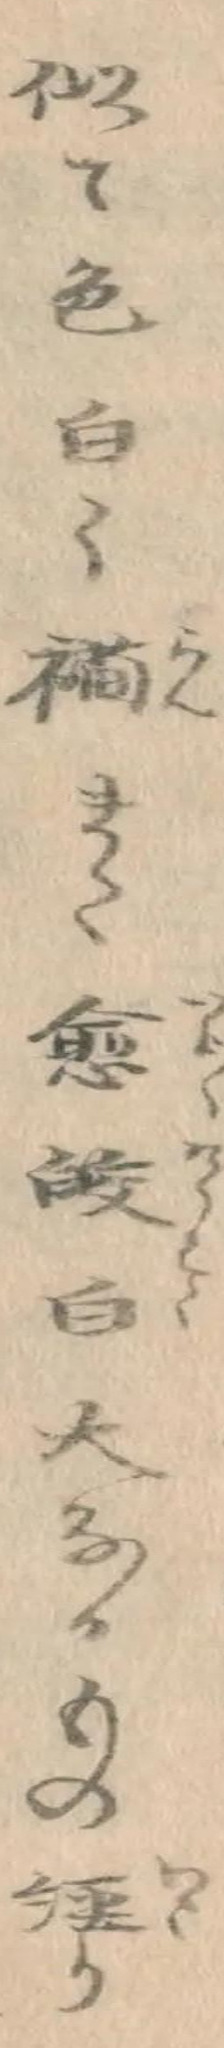似て色白くまた愈皎白大なるもの経り
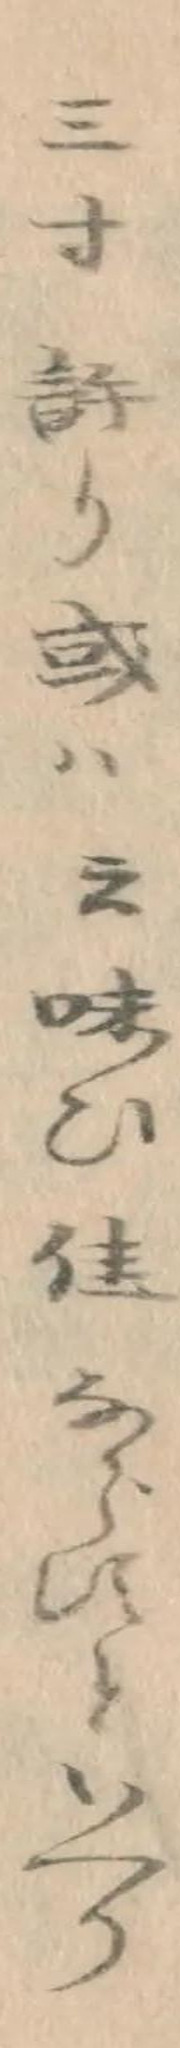三寸許り或は云味ひ佳ならすといへり

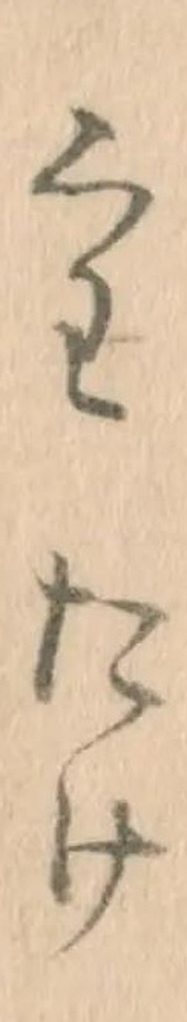くわたけ
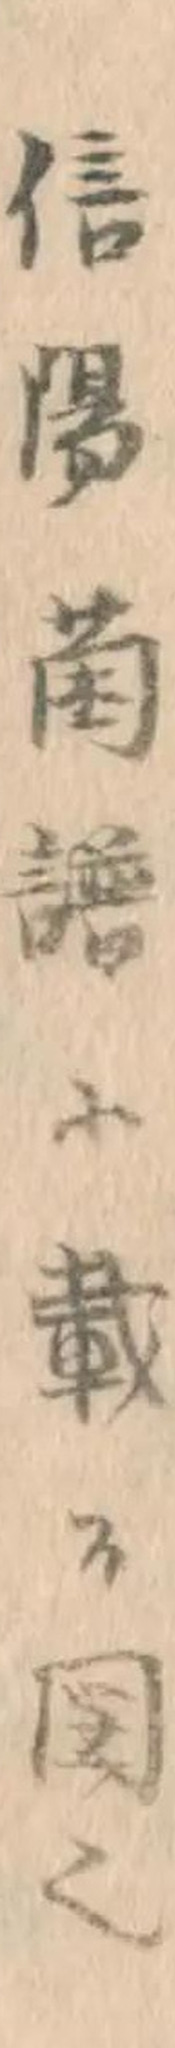信陽菌譜に載る図也
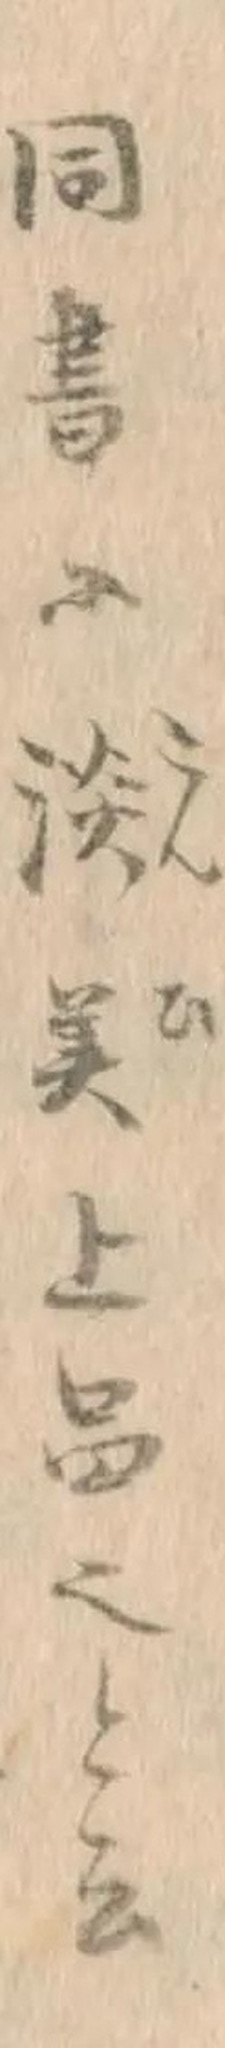同書に淡美上品也と云
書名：本草図譜. 巻55-57
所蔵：国立国会図書館 National Diet Library, JAPAN
